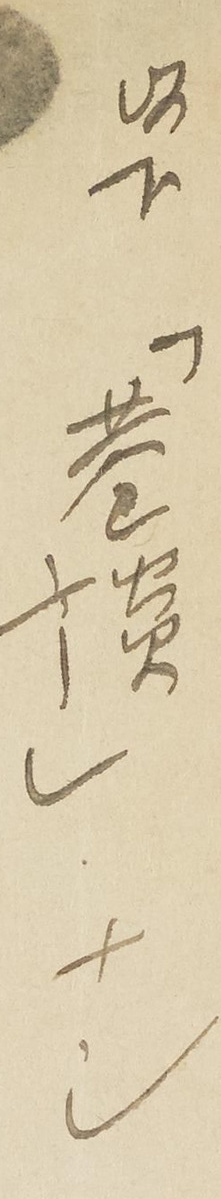以下「巷談」ナシ
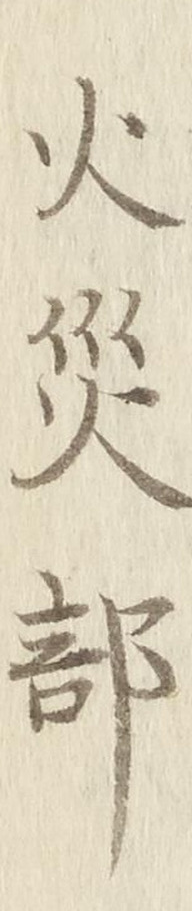火災部
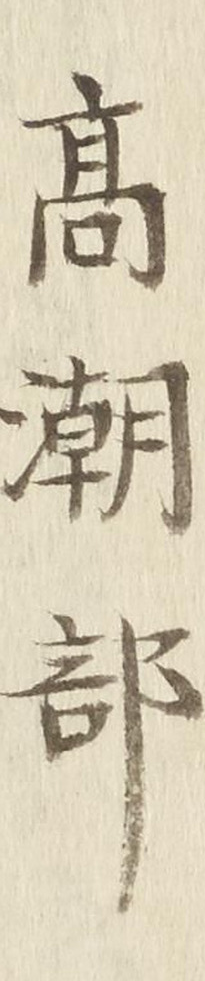高潮部

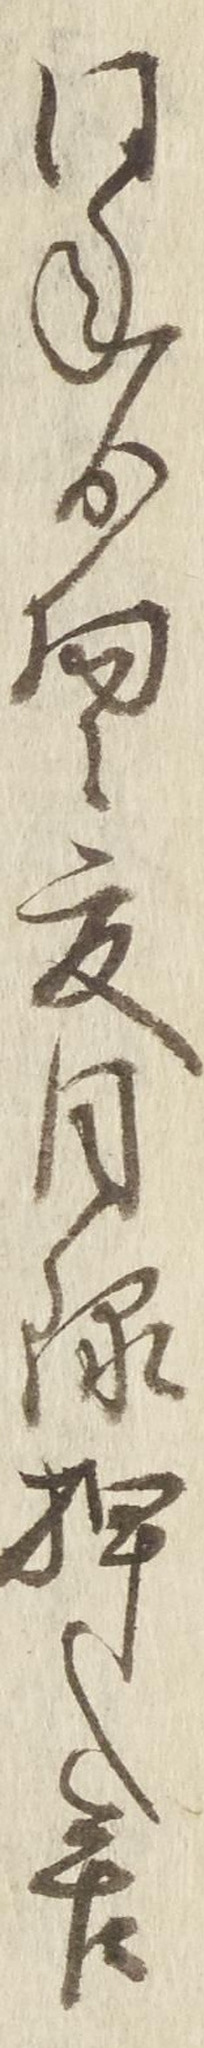同年より向々度目録押之筈
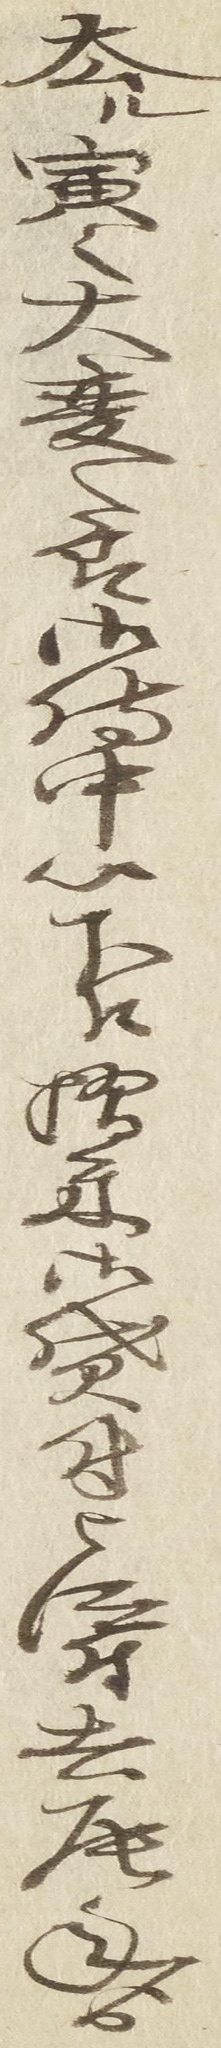去る寅之大変之節御侍中以下え摺米御貸付被仰付去辰年より
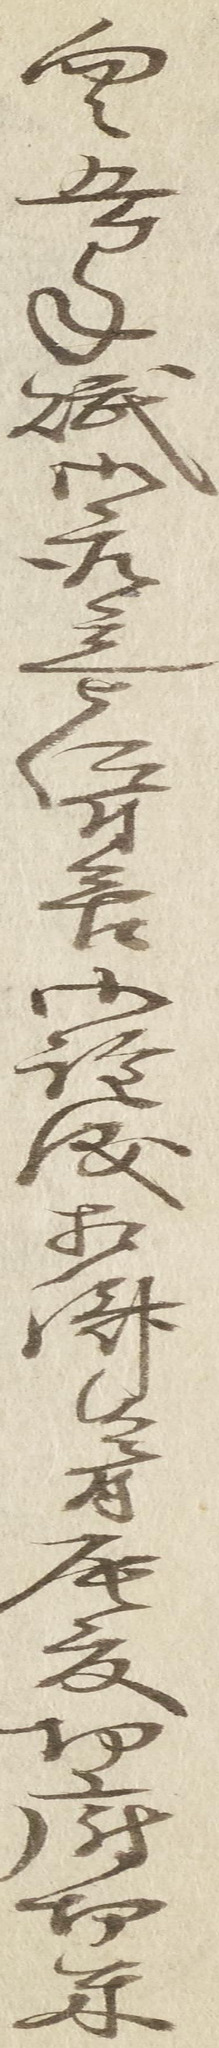向五ヶ年賦御取立被仰付筈御詮議相済候に付辰度切府切米
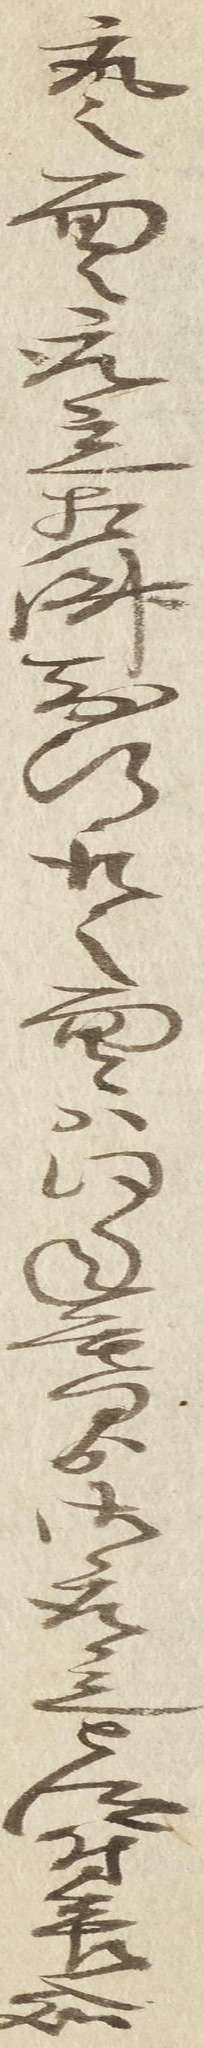取之面々取立相済知行取之面々は同年暮より御取立被仰付筈之処
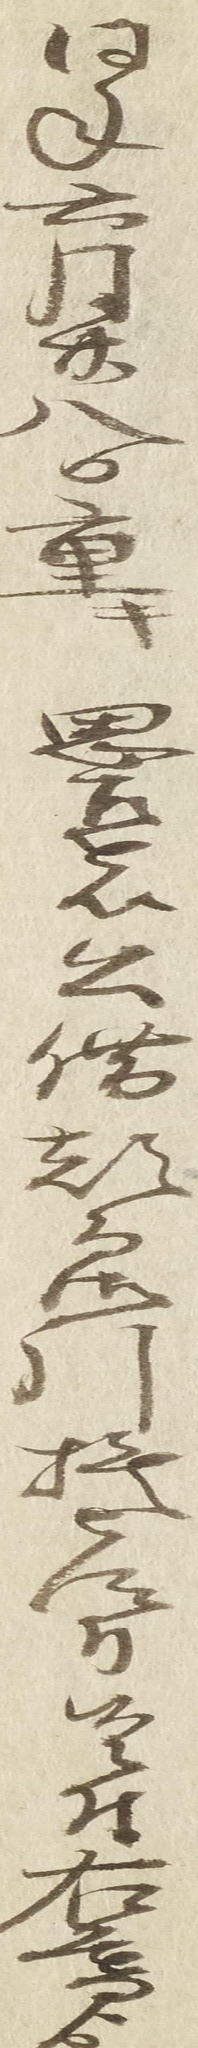同年六月廿八日重き思召を以公借都而御引捨被仰付候に付右暮より
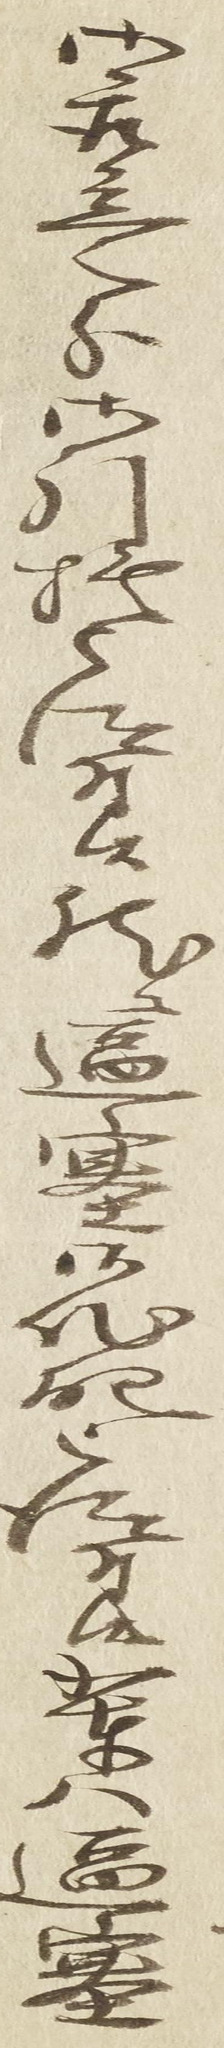御取立之分御引捨被仰付候然に逼塞御心配被仰付候輩は逼塞
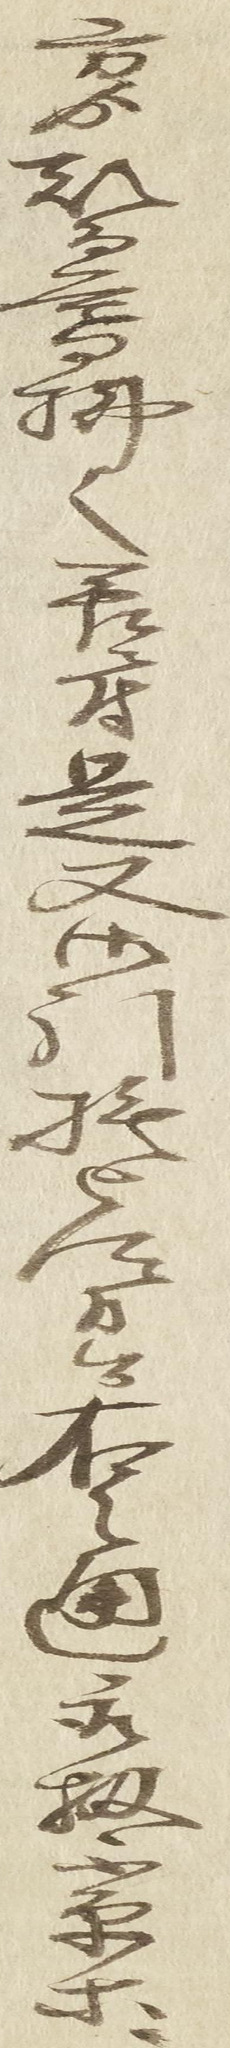方より都而暮払之筈に付是又御引捨被仰付候右之通取扱不平等
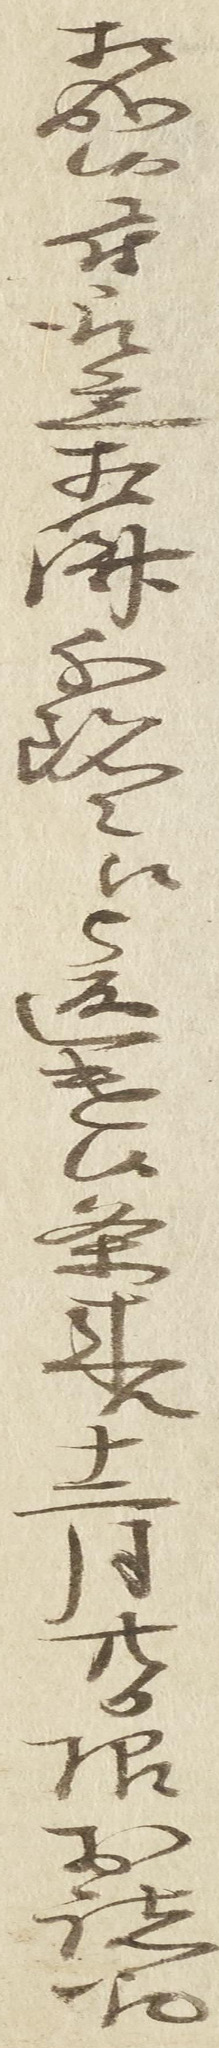相成候に付取立相済分銘々え被返遣候条来る十二月廿日限於諸取
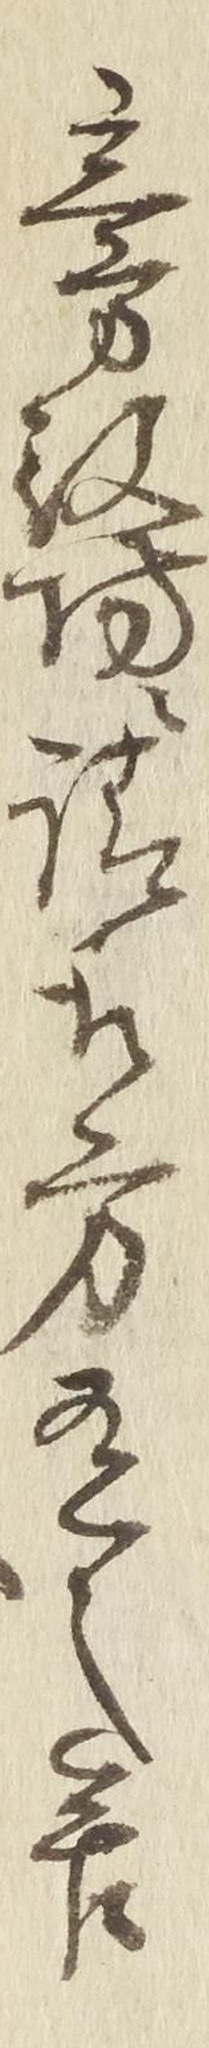立方役場に請取有之筈
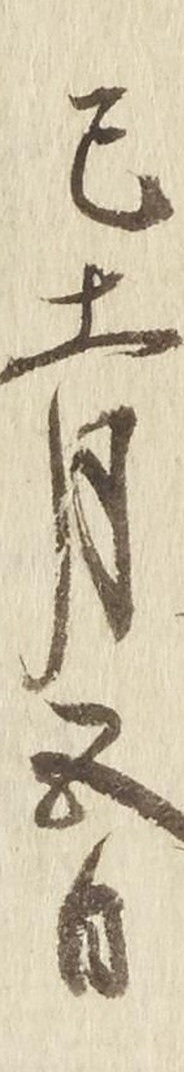巳十一月五日
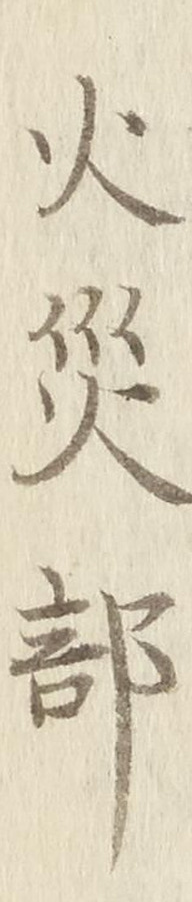火災部
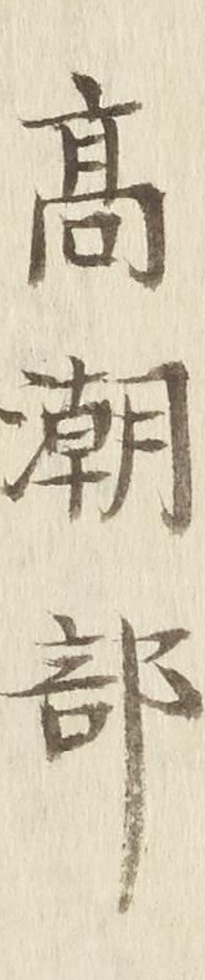高潮部

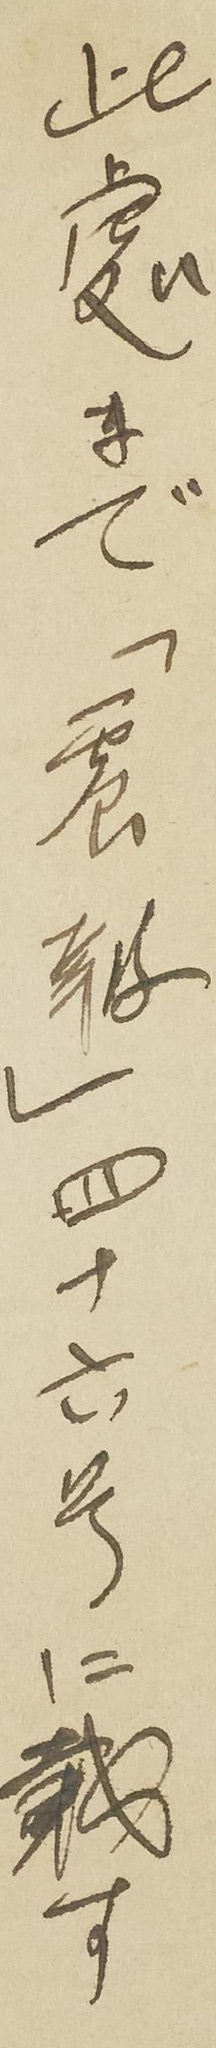此処まで「震報」四十六号に載す
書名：地震記　上
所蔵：東京大学地震研究所図書室 Earthquake Research Institute Library, The University of Tokyo, JAPAN
